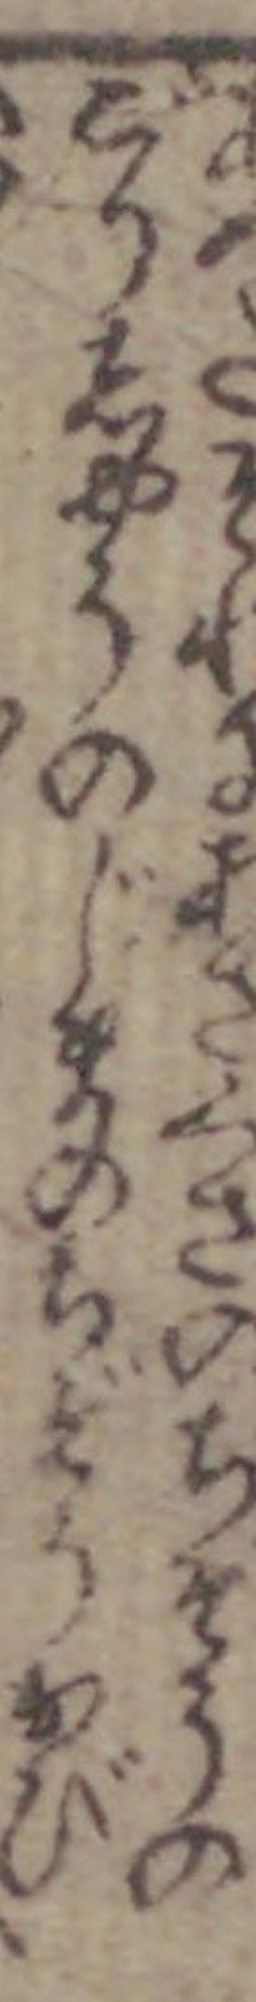ごりしやうのじまのちぞうおび
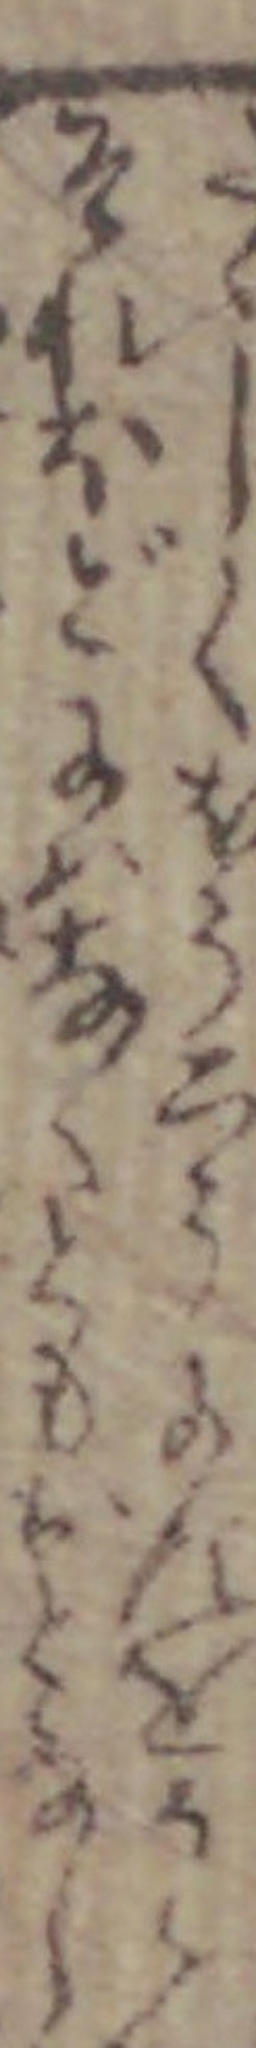それほどにはなくともおとなしく
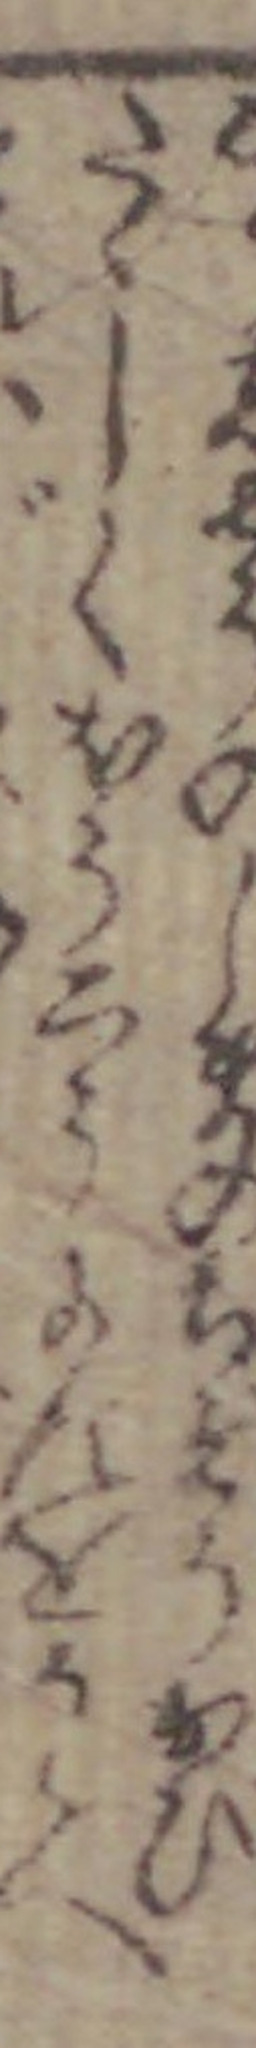たゝしくほうこうにんをかゝへ
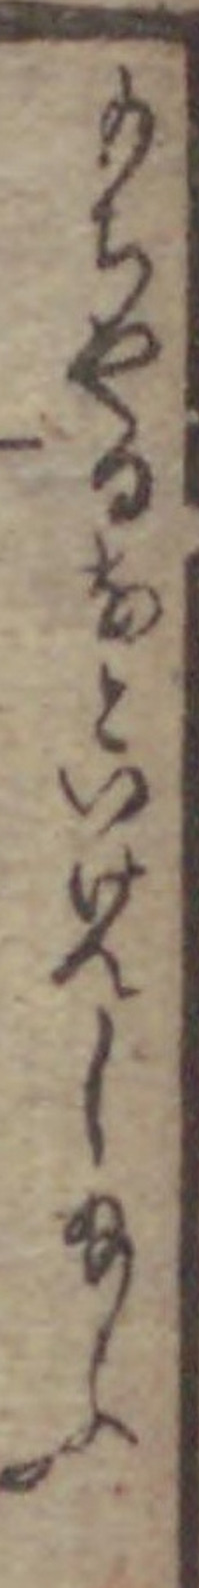もちやるなといけんし給ふ
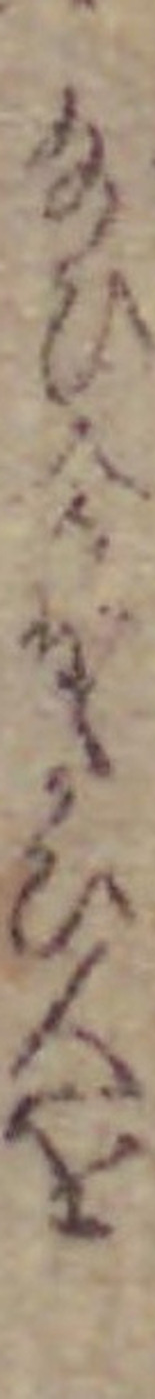給ひ今かたひ人を
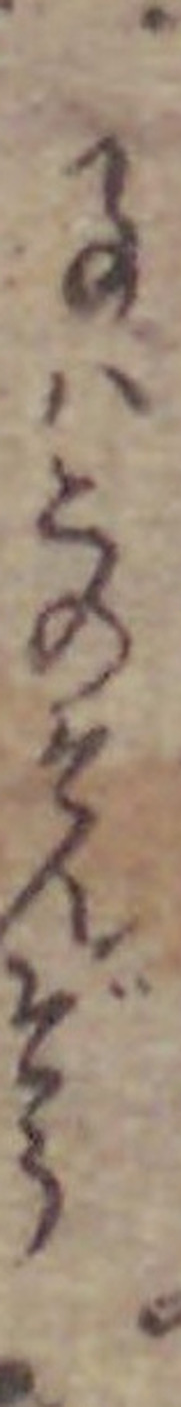事はこのそんぞう
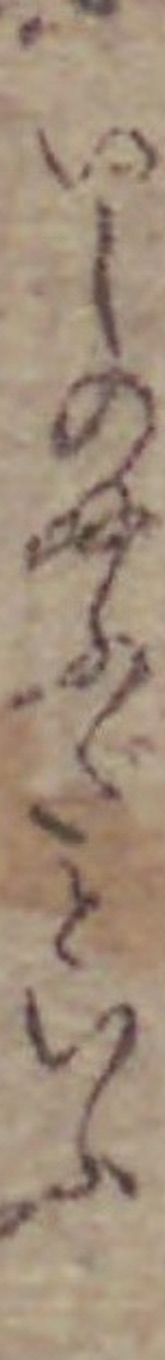いしのやふだといふ

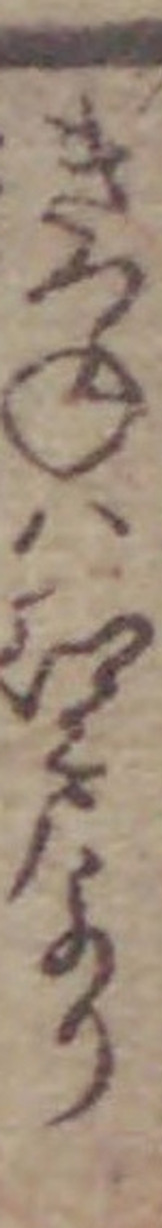きつねは江戸より
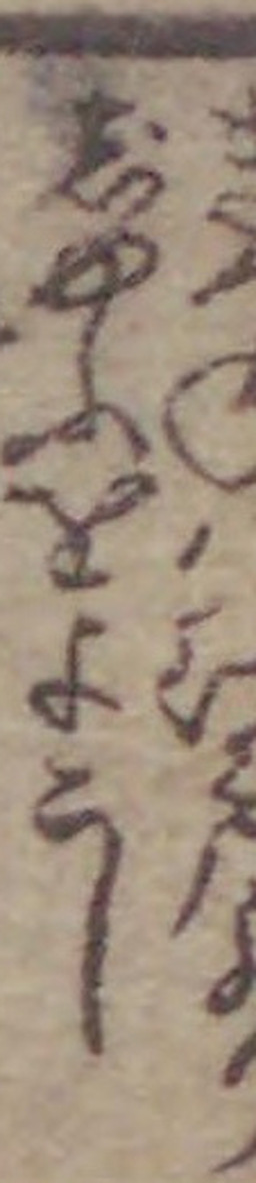しやふをよこし
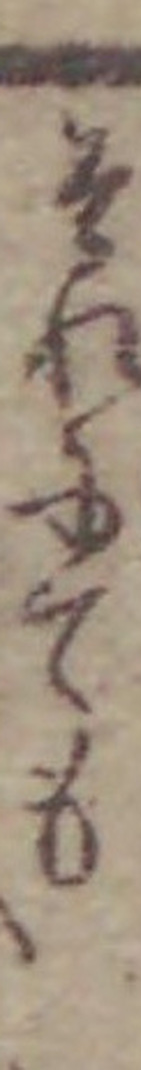それにても
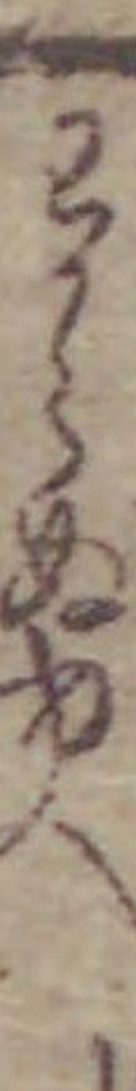わからぬゆへ
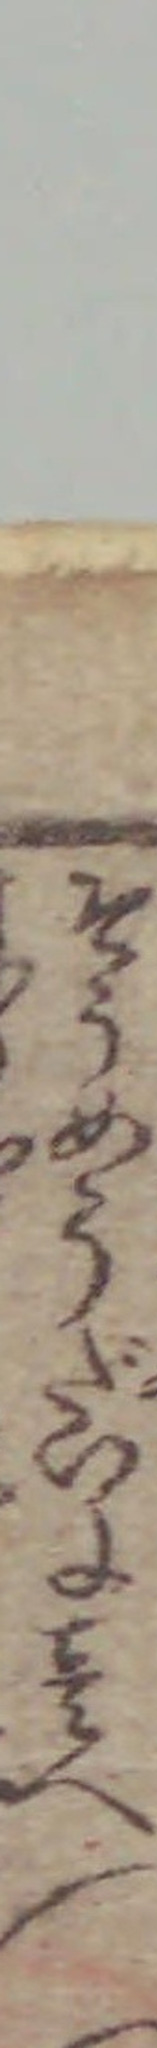そうめうだいに壹人
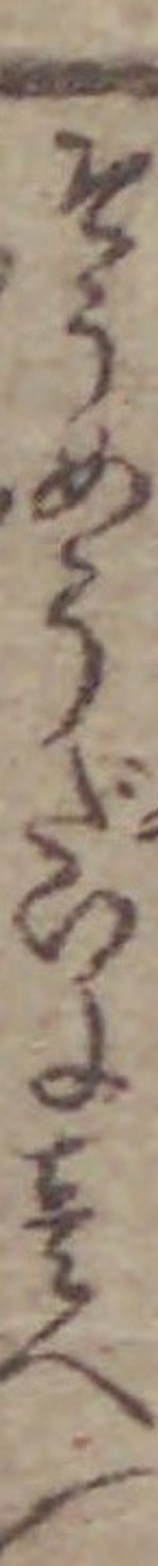そうめうだいに壹人
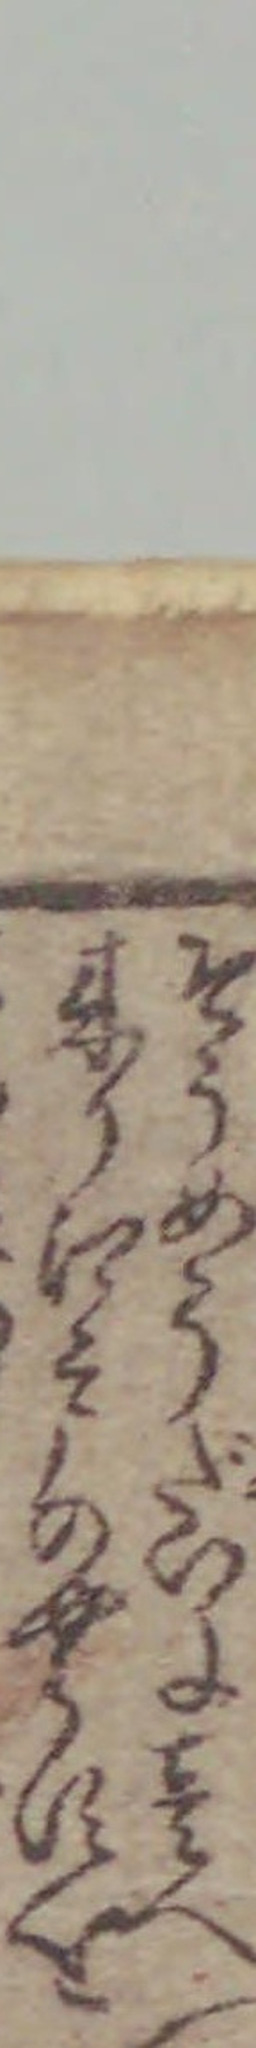来り江戸のやうすを
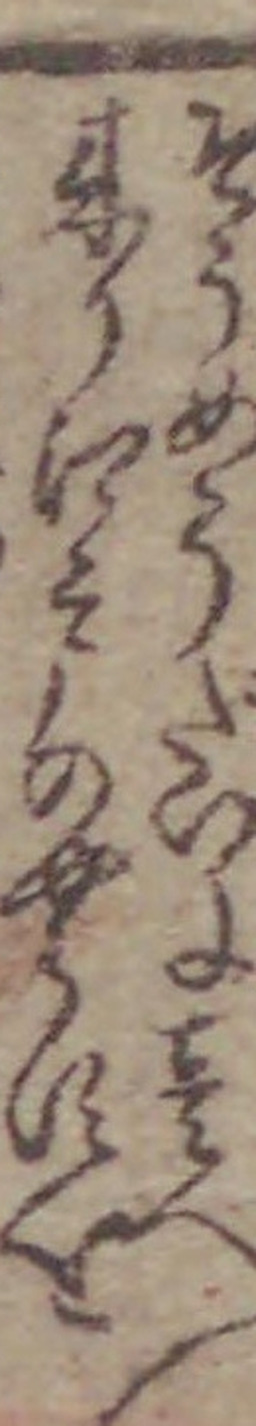来り江戸のやうすを
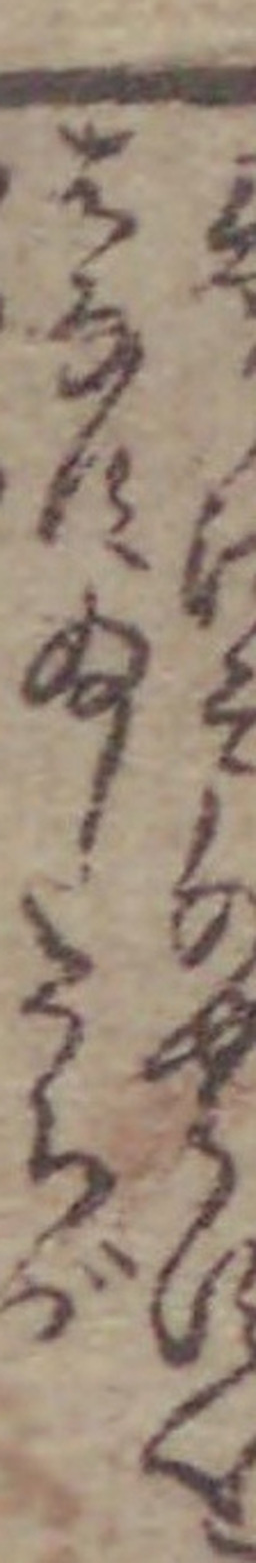はなすぬしたちが
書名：化物鼻がひしげ 2巻
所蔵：国立国会図書館 National Diet Library, JAPAN
